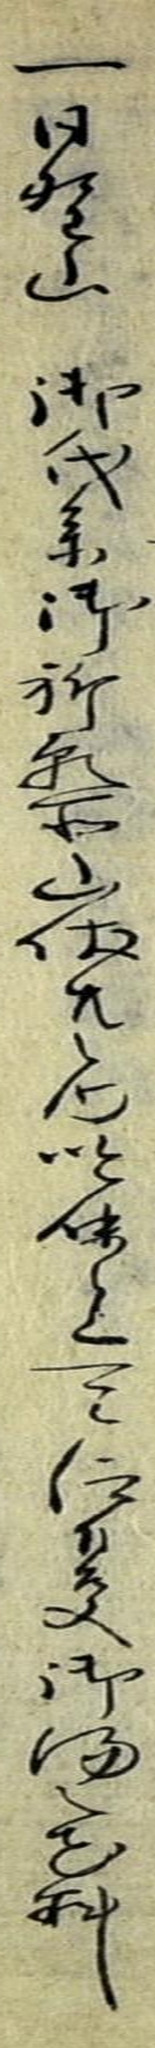一日野山御代参御祈願所山伏共之内吟味之上可被仰付事御湯花領料
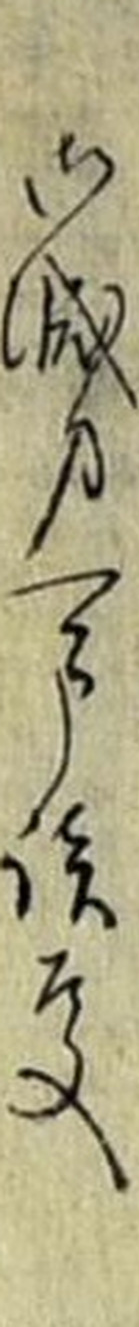御減方可申談可事
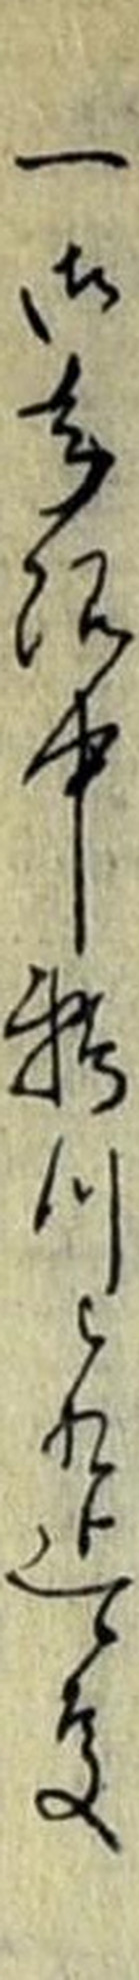一御年限中鵜川被相止候事
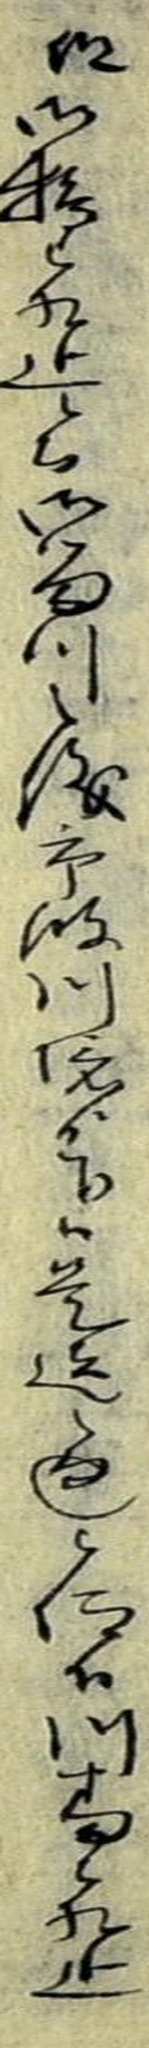但御鵜被相止候付御留川之儀市波川境ゟ下ハ是迄之通被仰付川番被相止
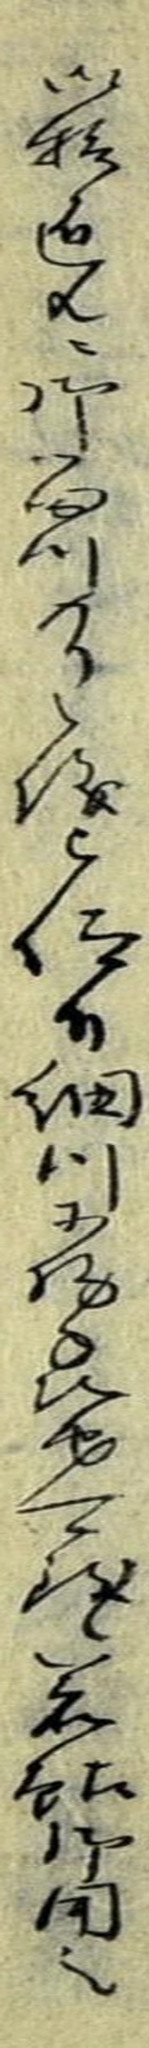御鵜匠共ニ御留川〆り之儀被仰付網川等勝手次第可致候若鮎御用之
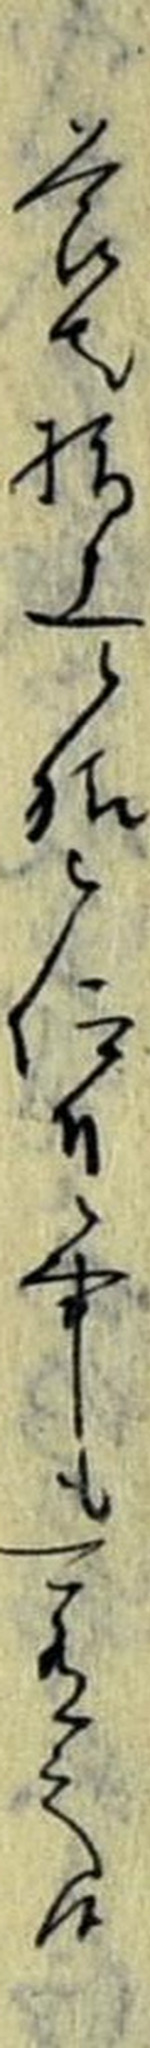節者指上候様被仰付候事も可有之候

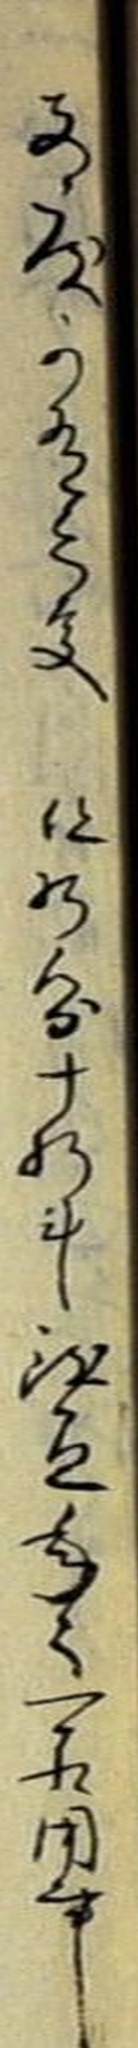支度可有之事但折紙十折斗致置年々可相用事

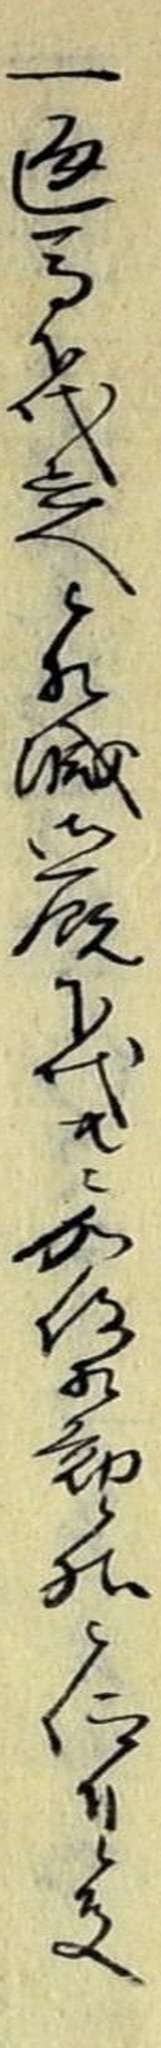一通馬下代壱人被相減御厩下代共ニ加役相勤候様被仰付候事
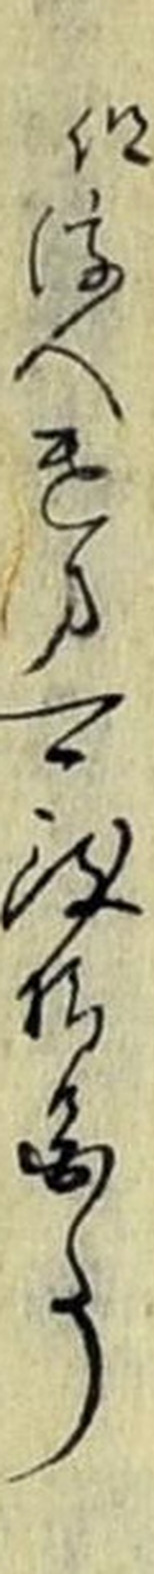但人遣方可致指図事
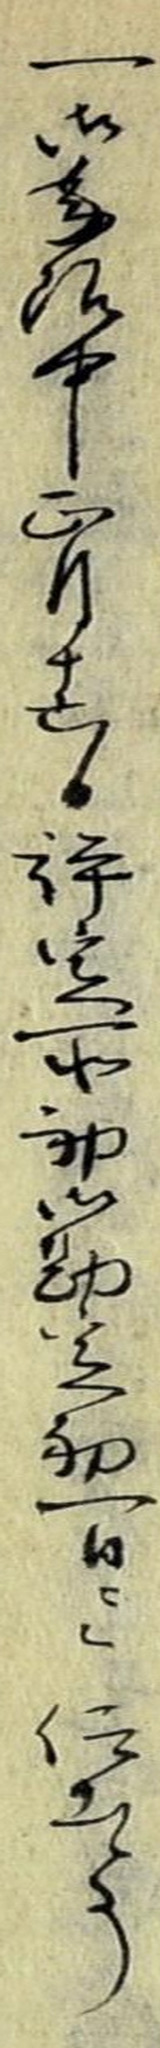一御年限中正月十六日評定所初御勘定初一日ニ被仰出候事
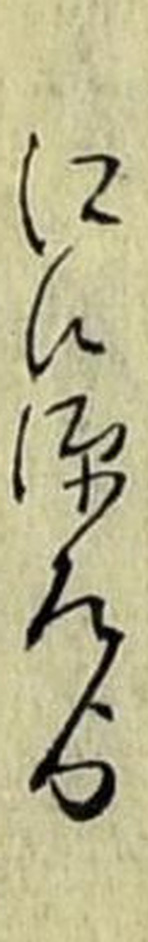江口源左衛門
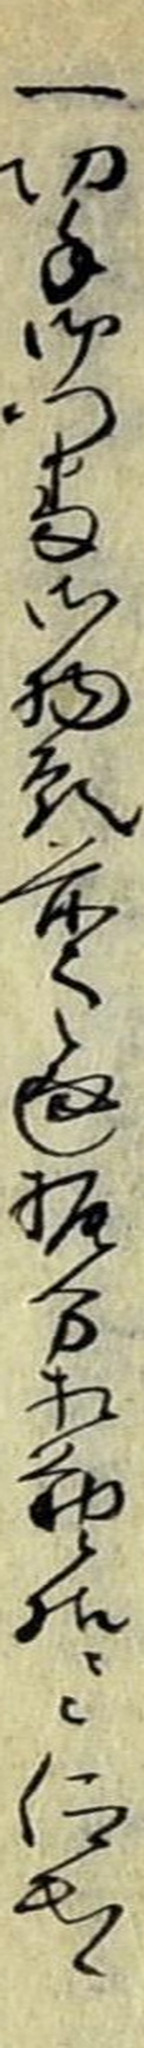一切手御門番御物頭前々之通振分相勤候様被仰出候
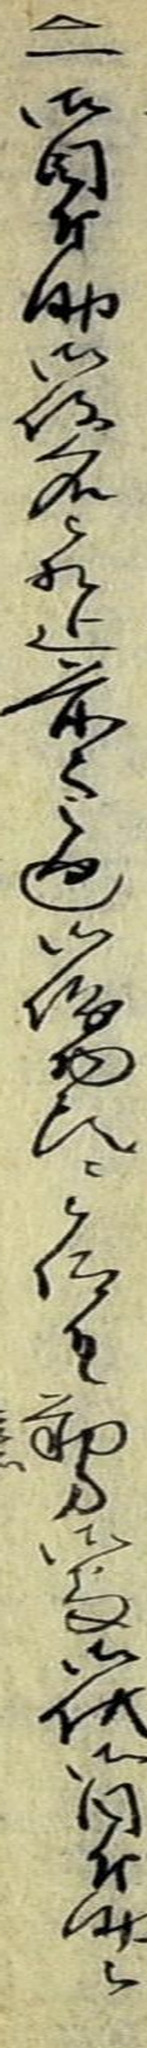△一御目付助御役名被相止前々之通御側物頭ニ被仰付候勤方御番御供御目付助被
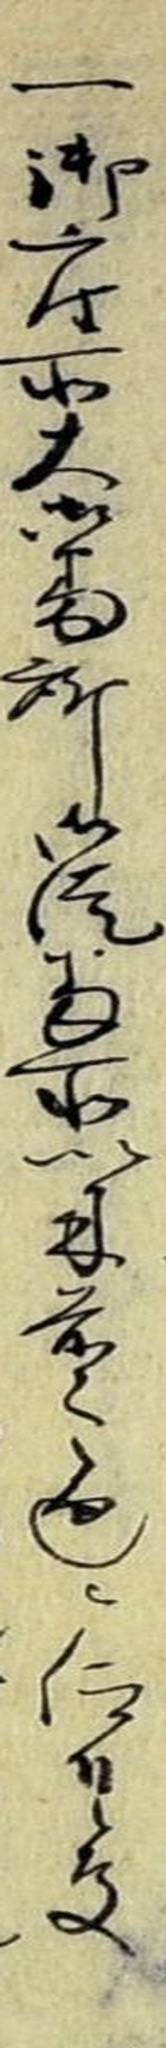一御座所大御番所御徒番所以来前々之通被仰付候事
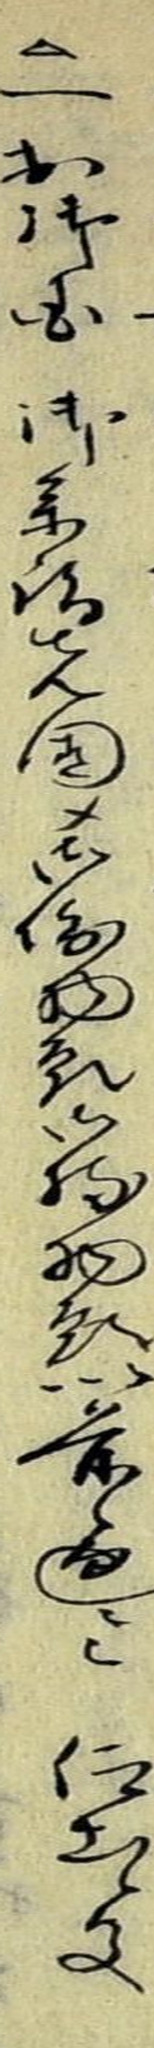△一於御国御参詣先固メ御側物頭御持物頭以前之通ニ被仰出候事
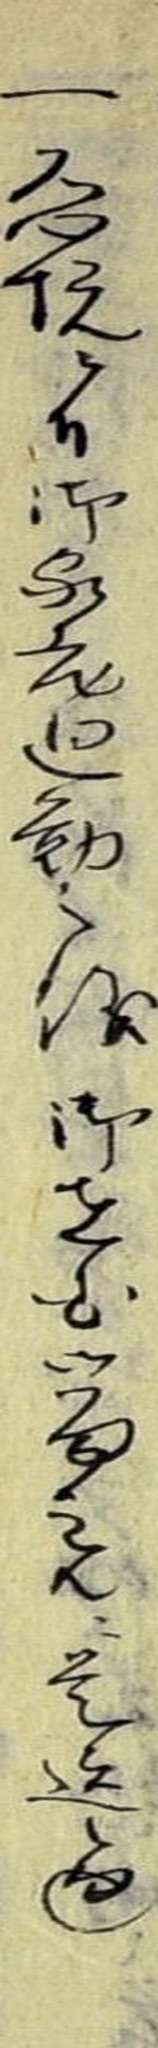一恐悦ニ付御家老廻勤之儀御在国御留守共ニ是迄之通
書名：命令之部 三
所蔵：福井県文書館 Fukui Prefectural Archives
